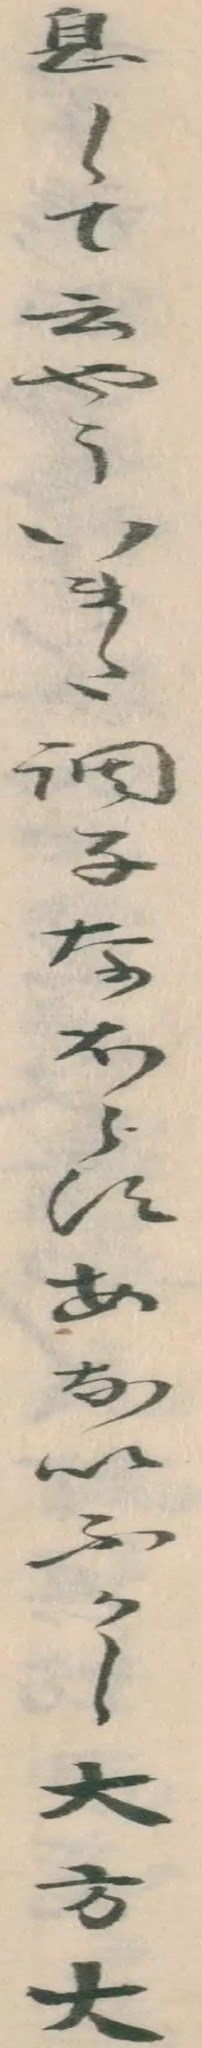息して云やういまた調子なほらすあないふかし大方大
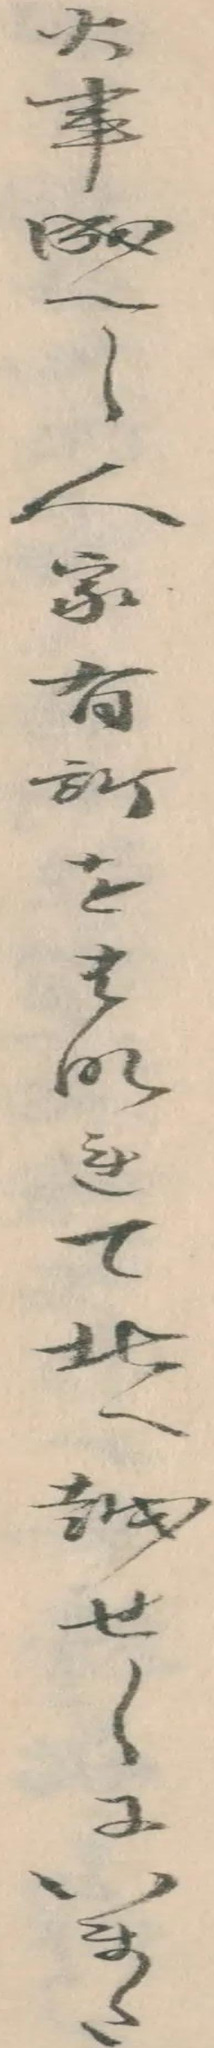火事成へし人家有所をはなれて北へ越せしにいまた

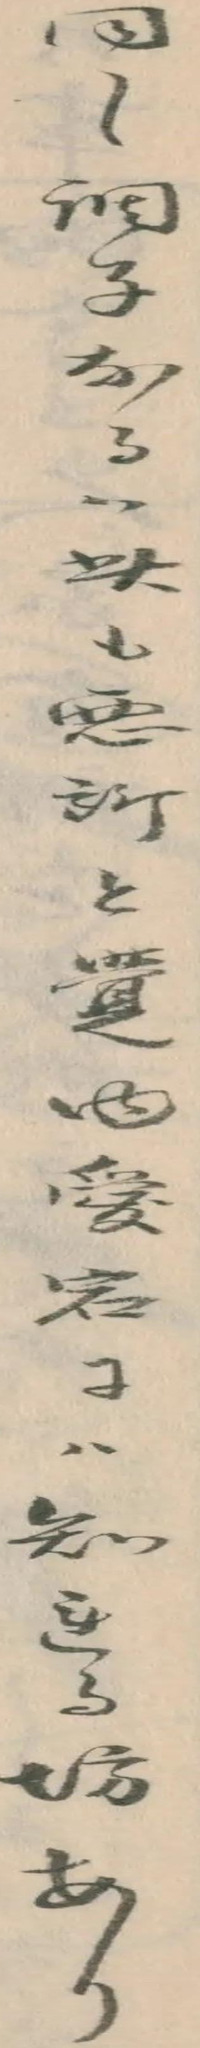同し調子なるは此も悪所と覚ゆ愛宕には知れる坊あり
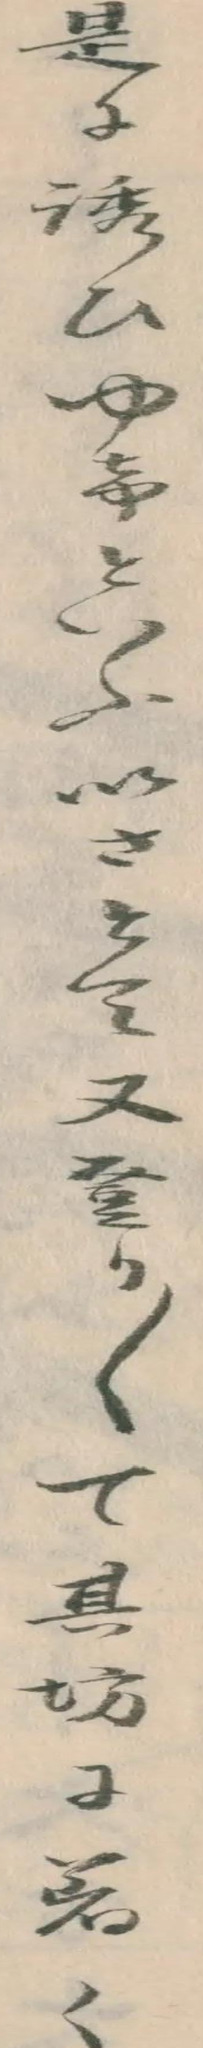是に誘ひゆけといふいさとて又登り〳〵て其坊に着く
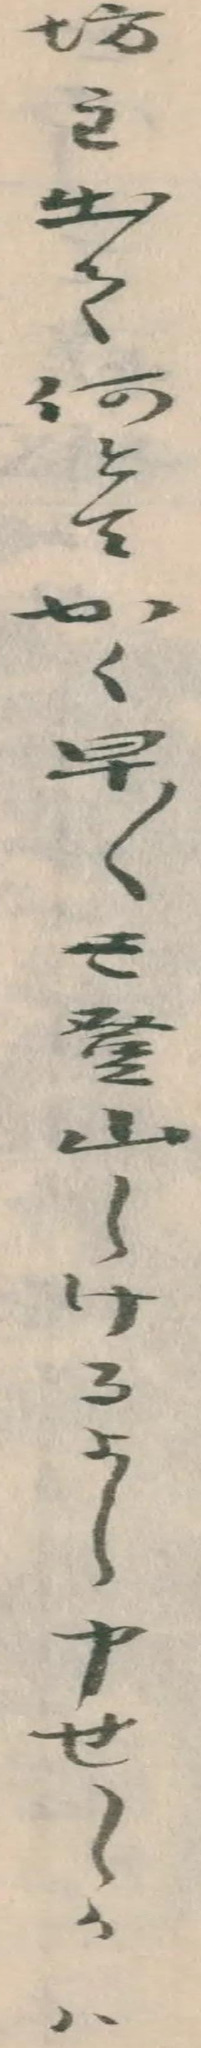坊主出て何とてかく早〳〵とは登山しけるよし申せしかは
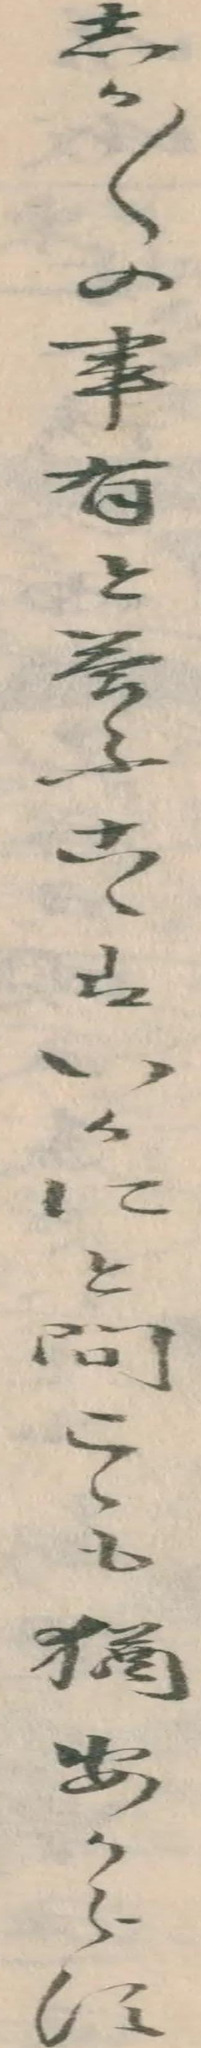しか〳〵の事有と答ふこゝはいかにと問こゝも猶安からす
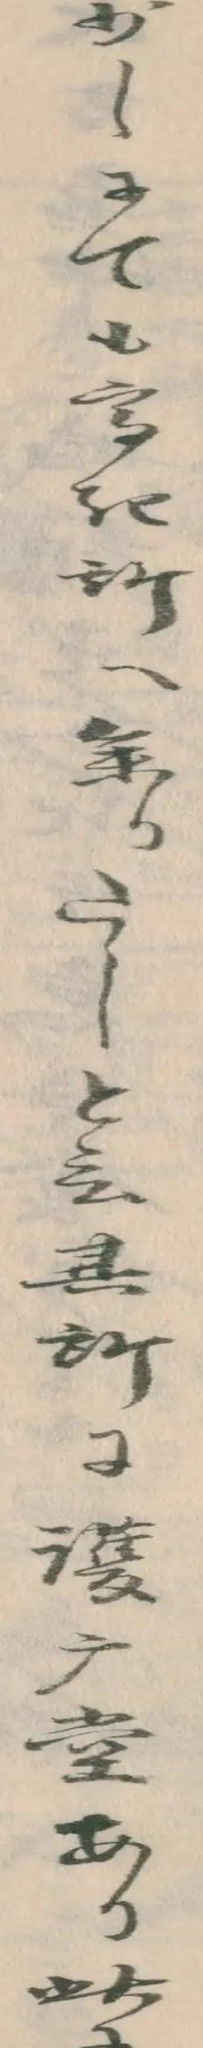少しにても高き所へ参りたしと言其所に護摩堂あり此に
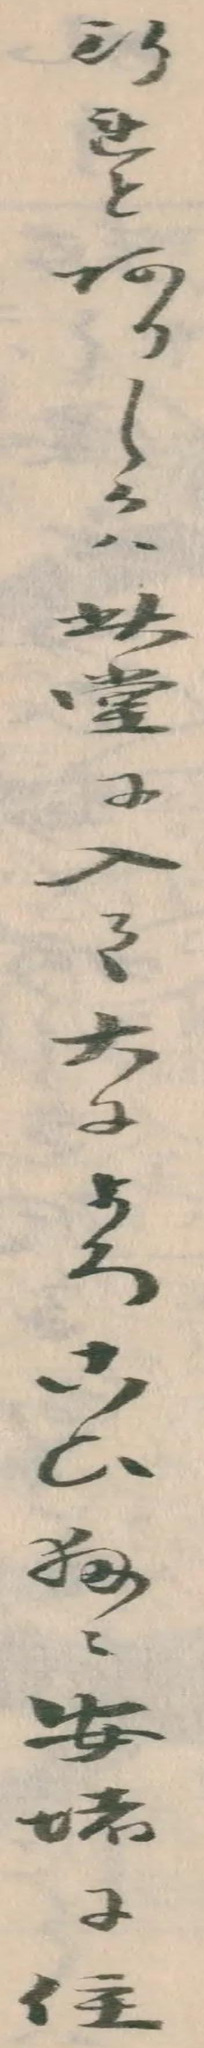行れとありしかは此堂に入て大によろこひ扨々安堵に住
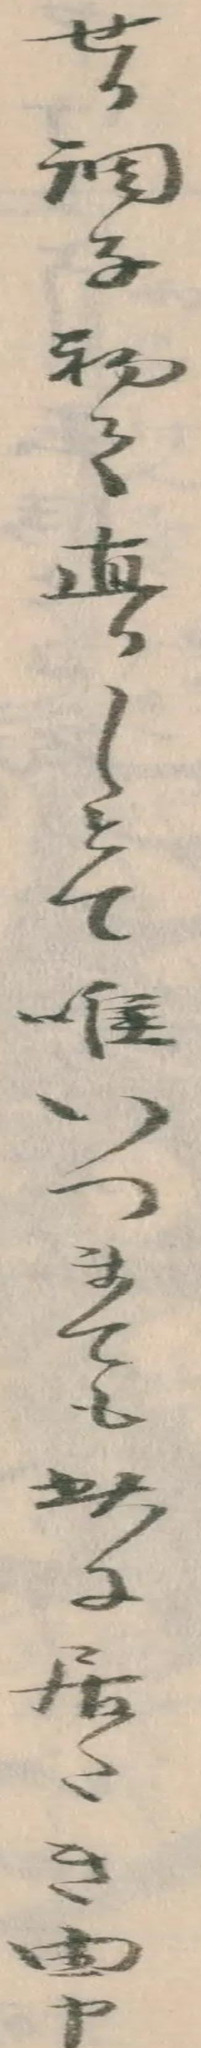せり調子初て直りしとて唯いつまても此に居たき由申
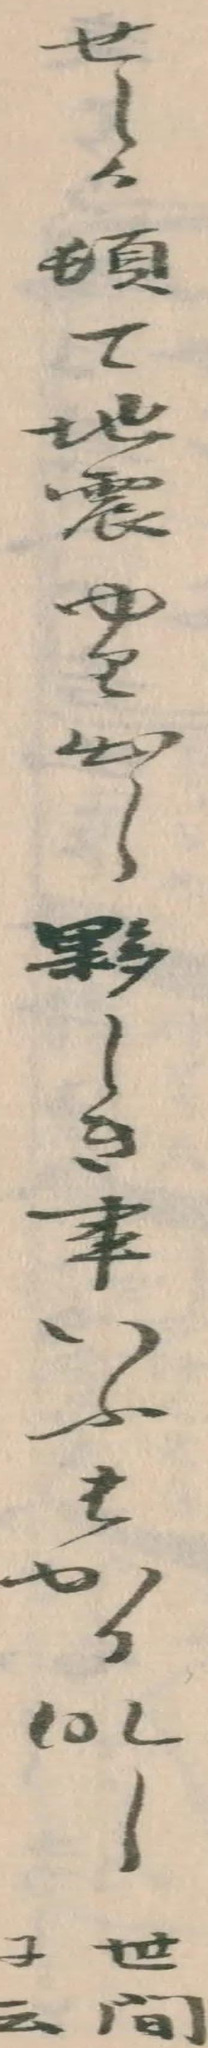せしか頓て地震ゆり出し夥しき事いふはかりなし世間に云
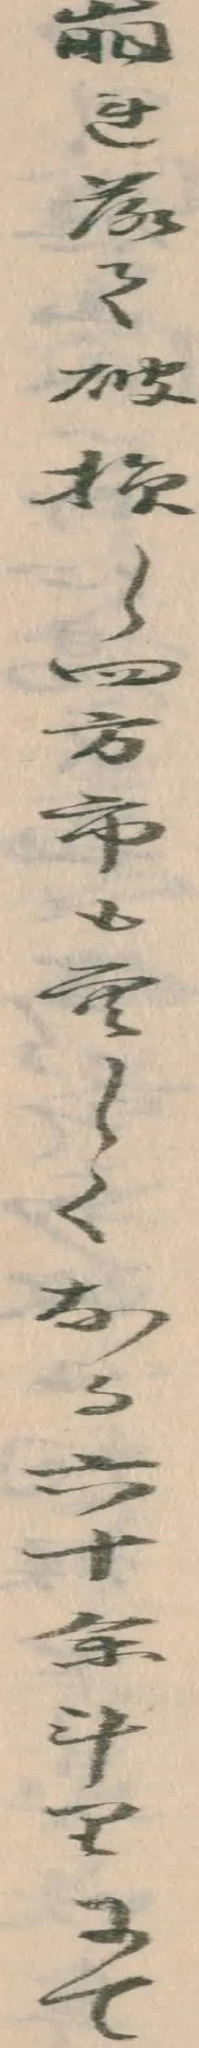崩れ落て破損し四方市も空しくなる六十余計りにて
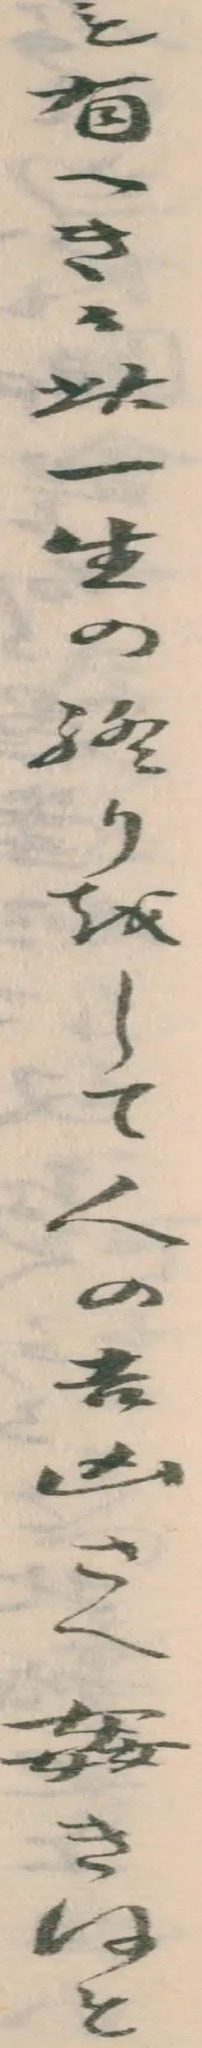も有へきか此一生の終りをして人の吉凶さへ姦きほと
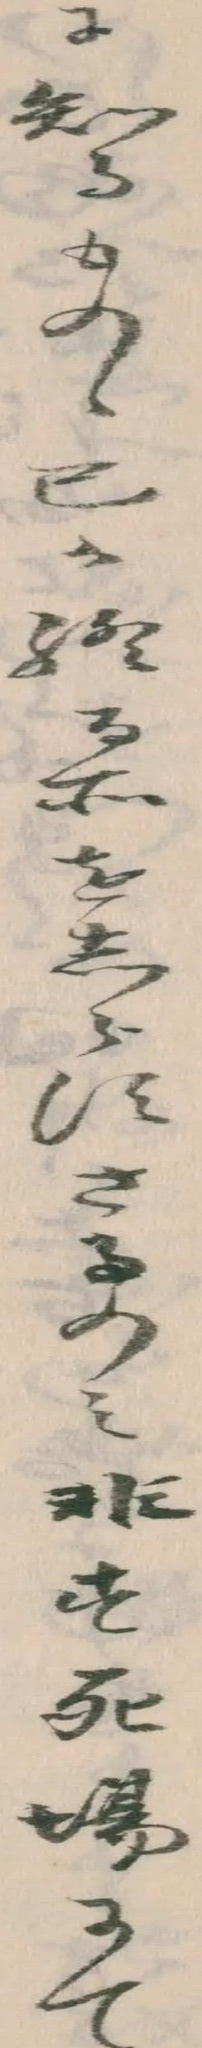に知るものゝ己か終る所をしらさるのみ非す死場にて
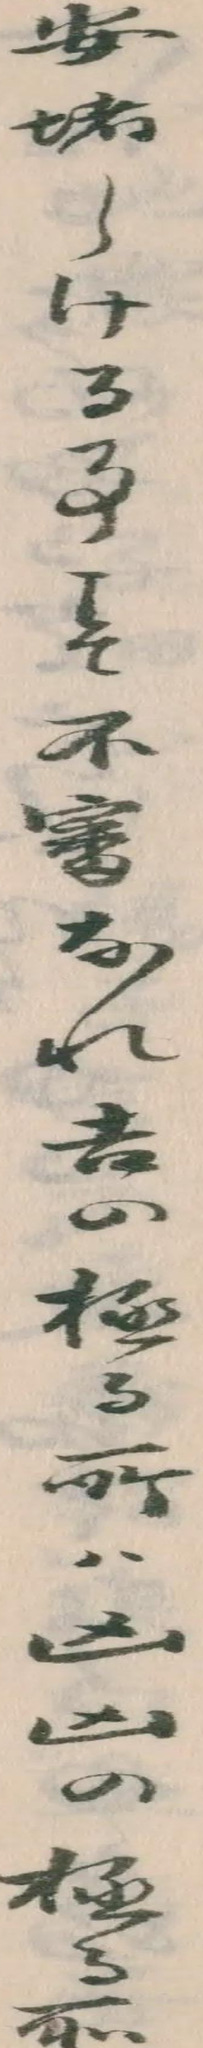安堵しける事こそ不審なれ吉の極る所は凶凶の極る所
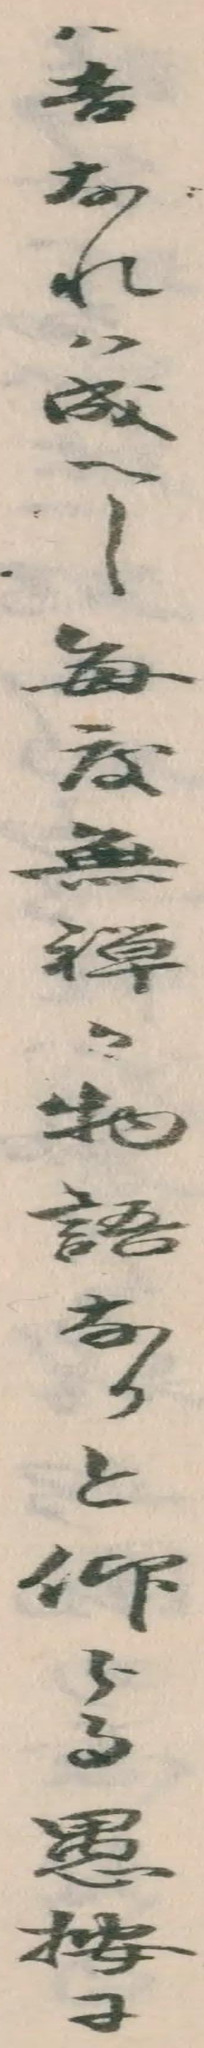は吉なれは成へし毎度無禅か物語なりと仰らる愚按に
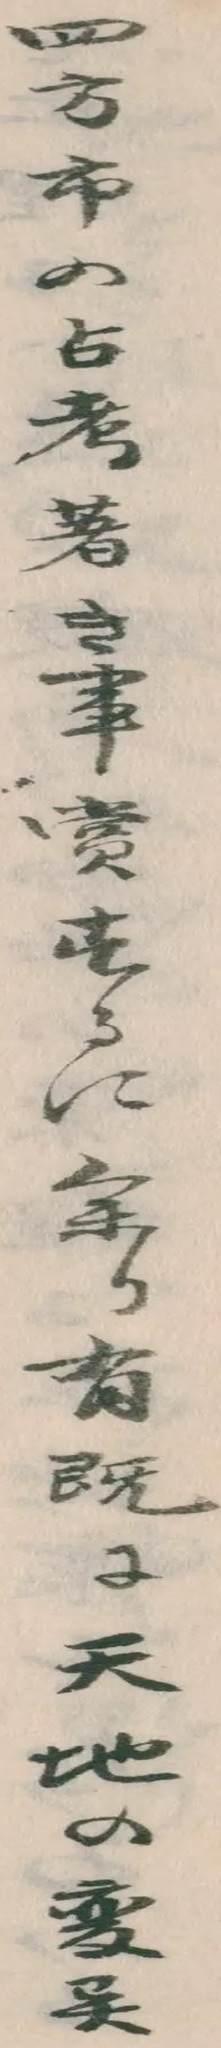四方市の占考著き事賞するに余り有既に天地の変異
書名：地災撮要. 巻11-12(地震之部)
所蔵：国立国会図書館 National Diet Library, JAPAN
